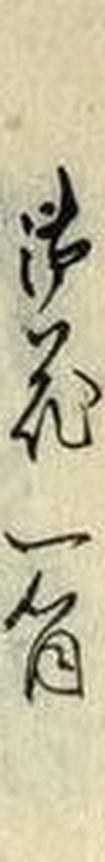御花一筒
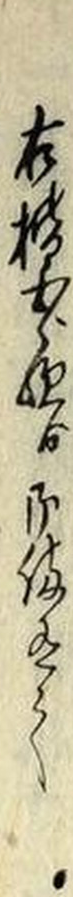右楷五郎様ゟ御備有之
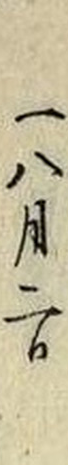一八月二日
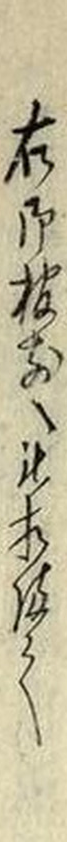右御棺前へ被相備之
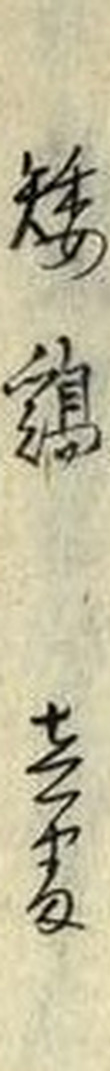矮鶏壱番
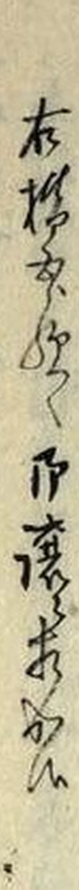右楷五郎様へ御譲ニ相成候
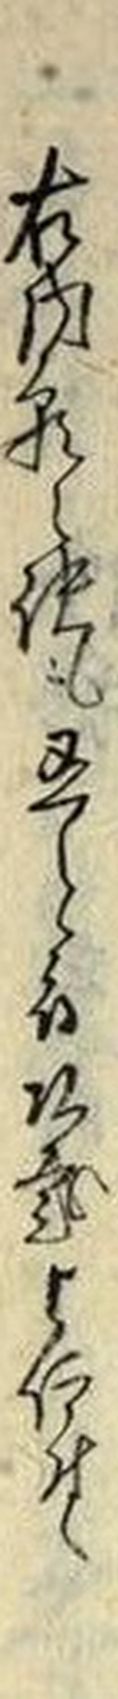右内願之訳も有之候付頂戴被仰付候

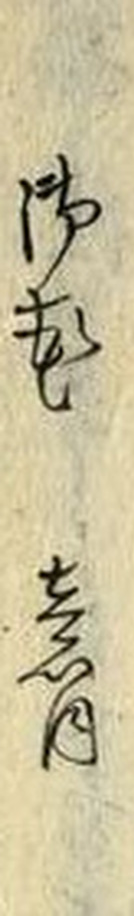御花壱筒
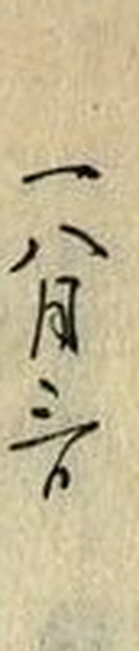一八月三日
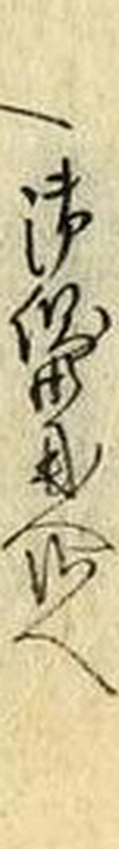御側御用人弐人
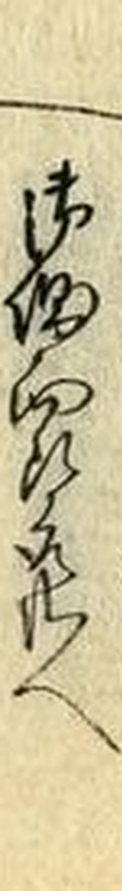御側向頭取弐人
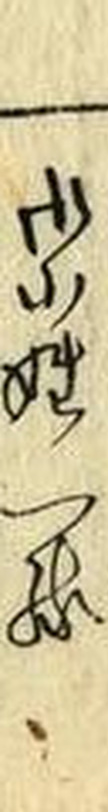御小姓一統
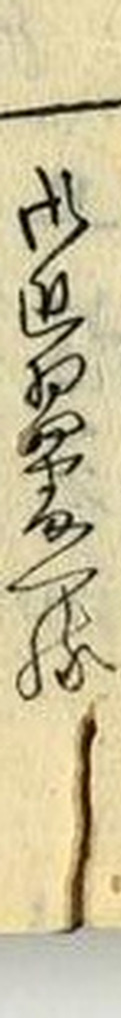御近習番一統
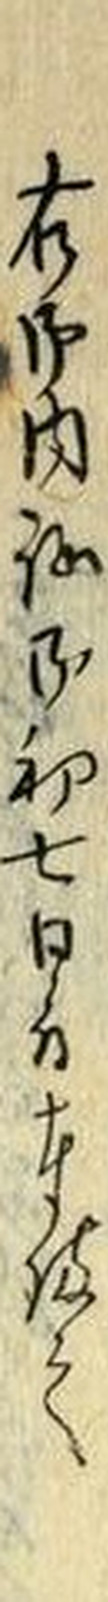右御内証御初七日ニ付奉備之
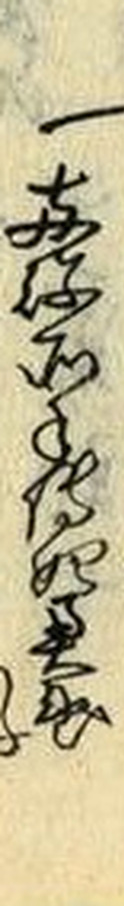両役所手伝始奥台子
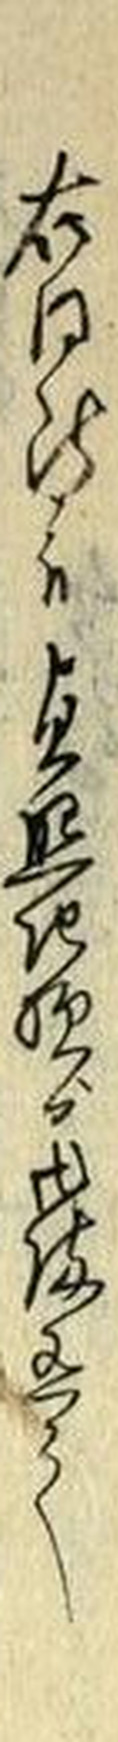右同断ニ付貞照院様ゟ御備有之
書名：少傅日録抄（斉善付側向頭取日記、江戸并道中、初入在国、逝去後…
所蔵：福井県文書館 Fukui Prefectural Archives
